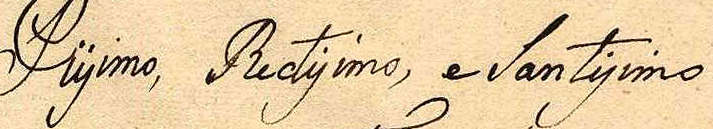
Piisimo, Rectisimo, e Santisimo
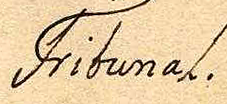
Tribunal.
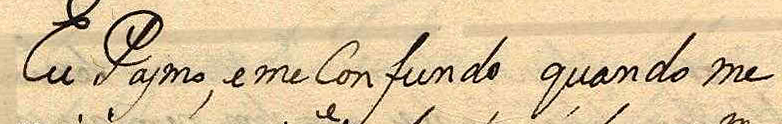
Eu Pasmo, e me Confundo quando me
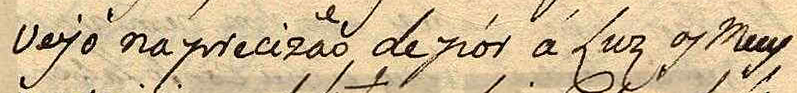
veyo na precizão de pór á Luz os meus
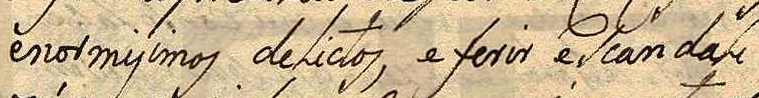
enormisimos deLictos, e ferir e scandaLi
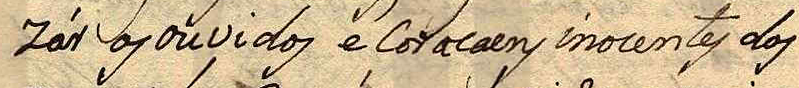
zár os ouvidos e Coracaens inocentes dos
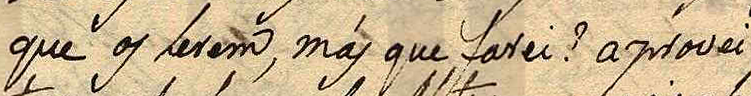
que os Lerem, más que farei? aprovei
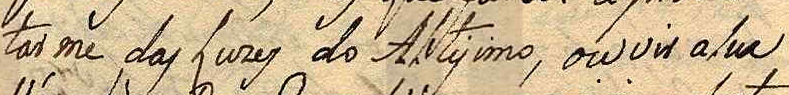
tarme das Luzes do Altisimo, ouvir a sua
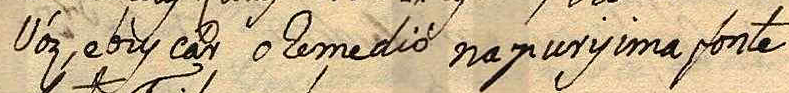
Vóz, e buscár o Remedio na purisima, fonte
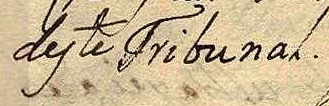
deste Tribunal.
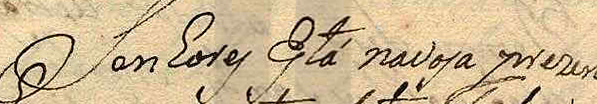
Senhores Está na vosa prezen
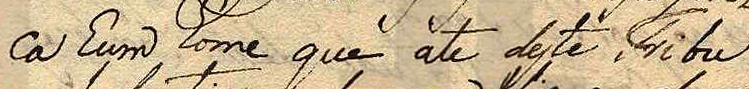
ca hum home que ate deste Tribu
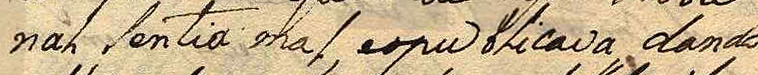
nal sentia mal, e o publicava dando
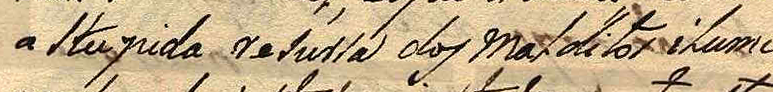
a stupida resursa dos malditos iLumi
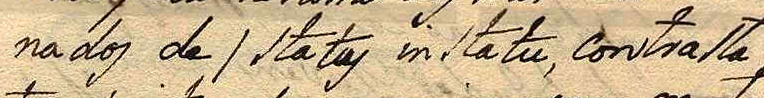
nados de / status in statu, contrasta
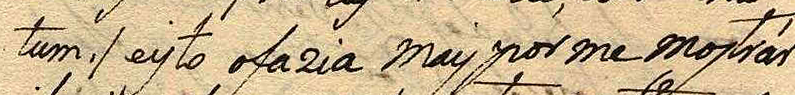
tum. / e isto o fazia mais por me mostrár
